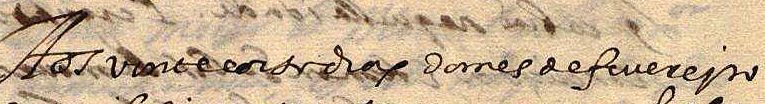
Aos vinte e oito dias do mes de feuereiro
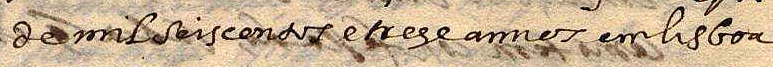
de mil seiscentos e treze annos em lisboa
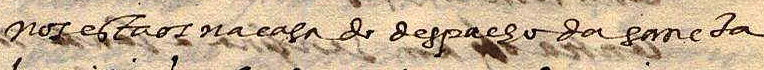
nos estaos na casa do despacho da sancta
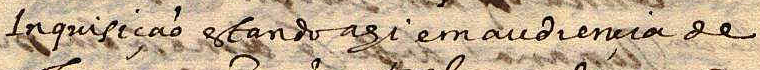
Inquisiçaõ estando ahi em audiencia de
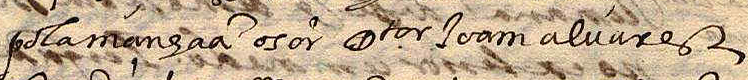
pola manhaā o sor̄ Dt.or Ioam aluares
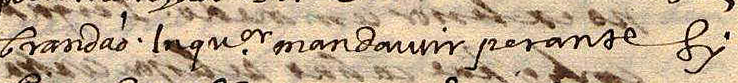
brandaõ Inqu.or mandou uir perante sy
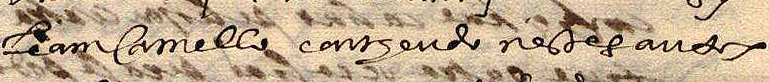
Leam Camello contheudo nestes autos
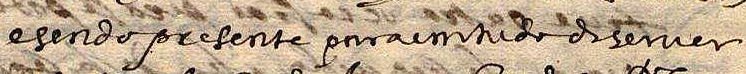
e sendo presente para em tudo dizer uer
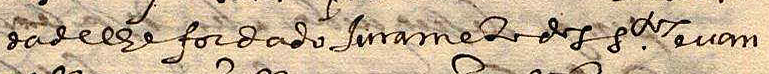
dade lhe foi dado Juramēto dos s.tos euan
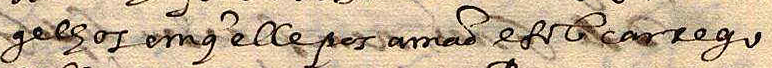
gelhos em q̄ elle pos a maõ e sob carrego
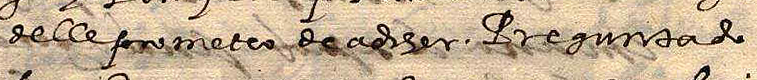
delle prometeo de a dizer. Preguntado
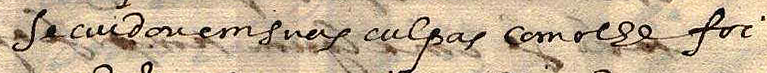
se cuidou em suas culpas como lhe foi
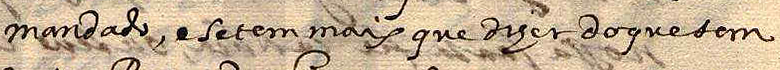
mandado, e se tem mais que dizer do que tem
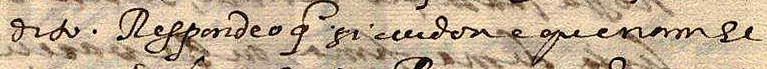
dito. Respondeo q̄ si cuidou e que nam he
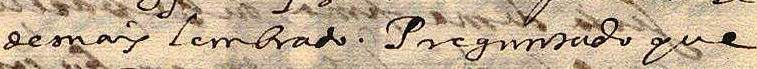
de mais lembrado. Preguntado que
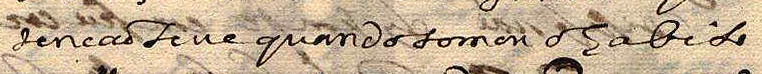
tençaõ teue quando tomou o habito
